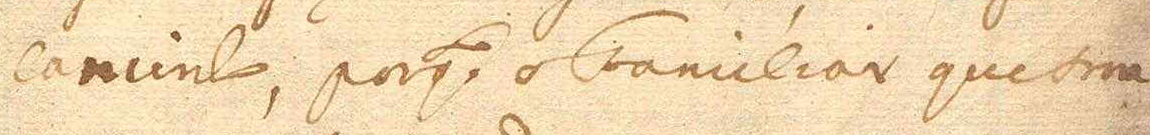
caminho, porqto o Framiliar que trou
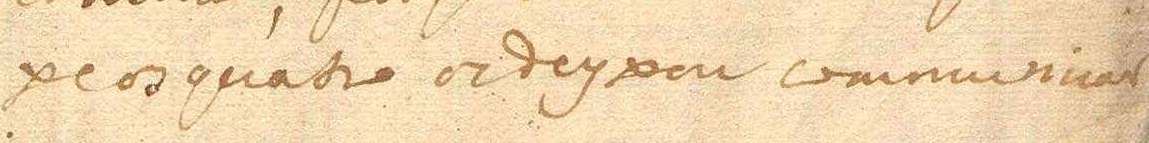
xe os quatro os deyxou communicar
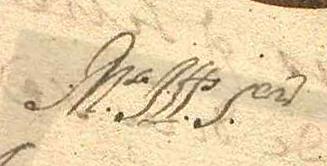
M.to Ilt.s S.res
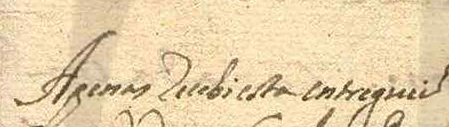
Apenas Recebi esta entreguei
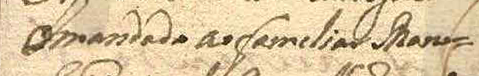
O mandado ao familiar Mano
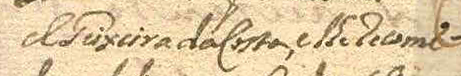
el Teixeira da Costa, e lhe Recomē
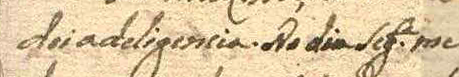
dei a deligencia. No dia seg.te me
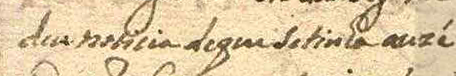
deu noticia de que se tinha auzē
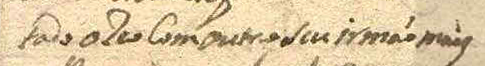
tado o Reo Com outro seu irmaõ mais
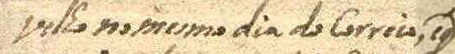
velho no mesmo dia do Correio, e q̄
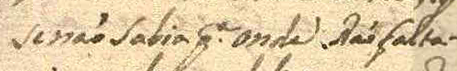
se naõ sabia p.a onde Naõ falta
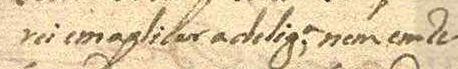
rei em aplicar a dilig.a, nem em Re
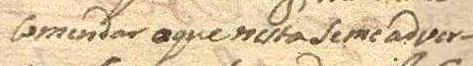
comendar o que nesta se me adver
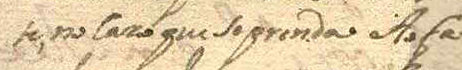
te, no cazo que se prenda Ao fa
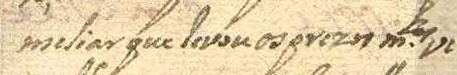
meliar que levou os prezos m.tas ve
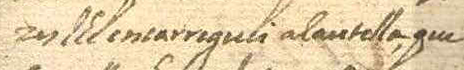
zes lhe encarreguei a Cautella, que
